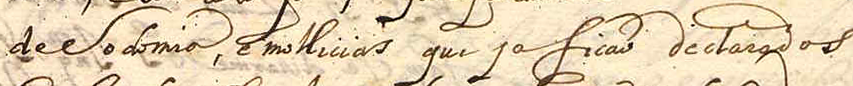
de Sodomia, E mollicias que ja ficaõ declarados
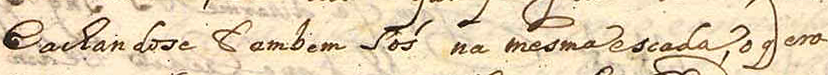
E achandose Tambem sós na mesma escada, o q̄ era
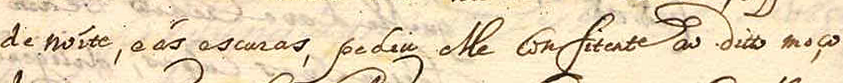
de noite, e ás escuzas pediu elle Confitente ao ditto moço
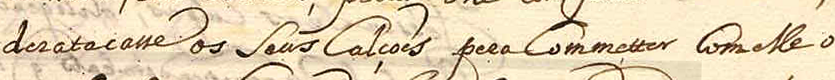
dezatacasse os seus Calçoẽs, pera Commetter Com elle o
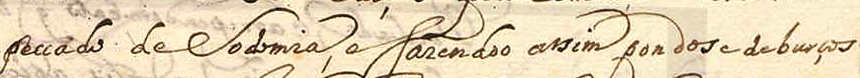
peccado de Sodomia, e fazendoo assim pondose de burços
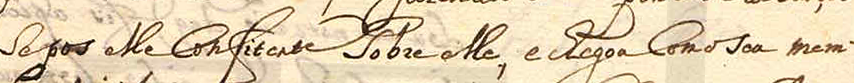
se pos elle Confitente Sobre elle, e chegou Com o seu mem
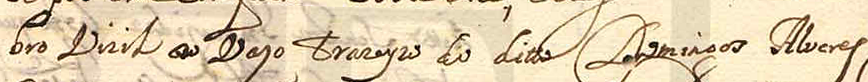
bro Viril ao Vaso trazeyro do ditto Domingos Alveres,
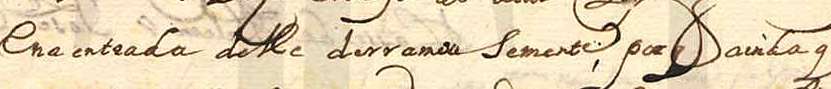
E na entrada delle derramou semente, por q̄ ainda q̄
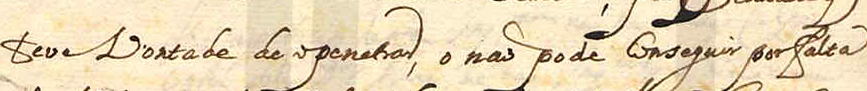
teve Vontade de o penetrar, o naõ pode Conseguir por falta
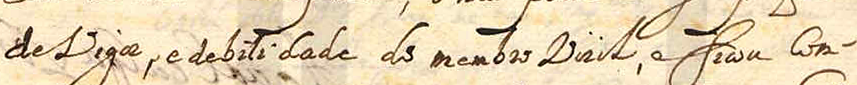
de Vigor, e debilidade do membro Viril, e ficou Con
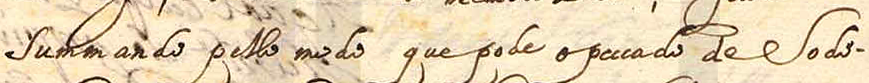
summando pello modo que pode o peccado de Sodo
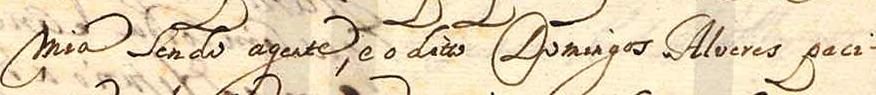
mia Sendo agente, e o ditto Domigos Alveres paci
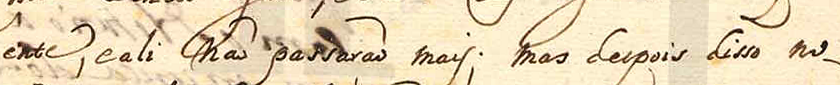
ente, e ali naõ passaraõ mais; mas despois disso no
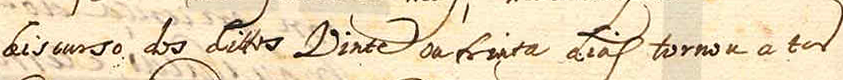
discurso, dos dittos Vinte ou trinta dias tornou a ter
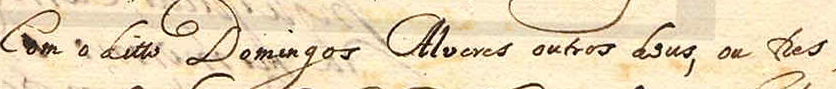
com o ditto Domingos Alveres outros dous, ou tres
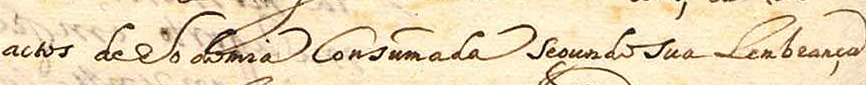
actos de Sodomia Consumada segundo sua Lembrança
